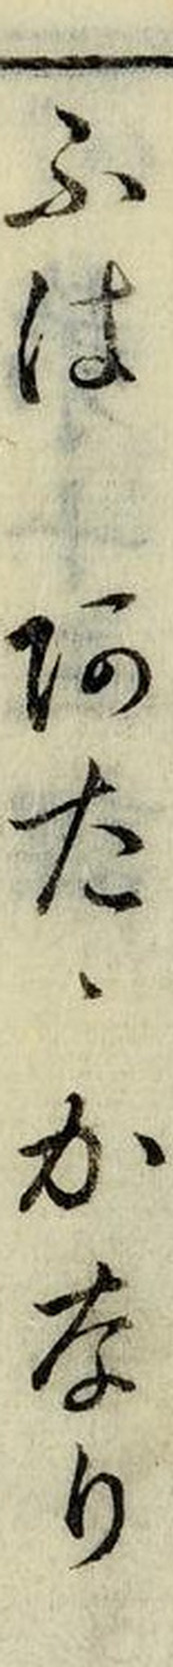ふはあたヽかなり
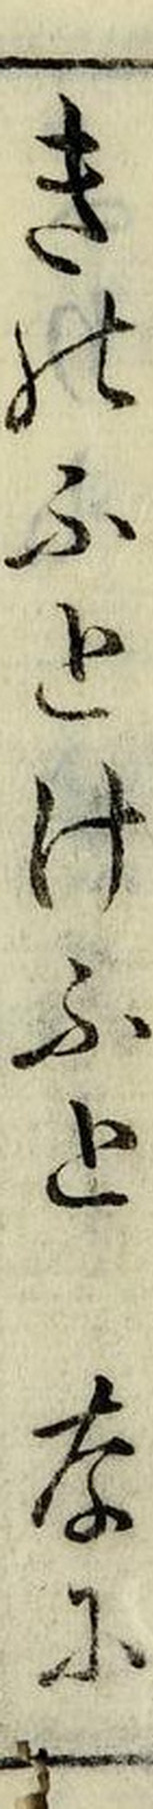きのふとけふとなに
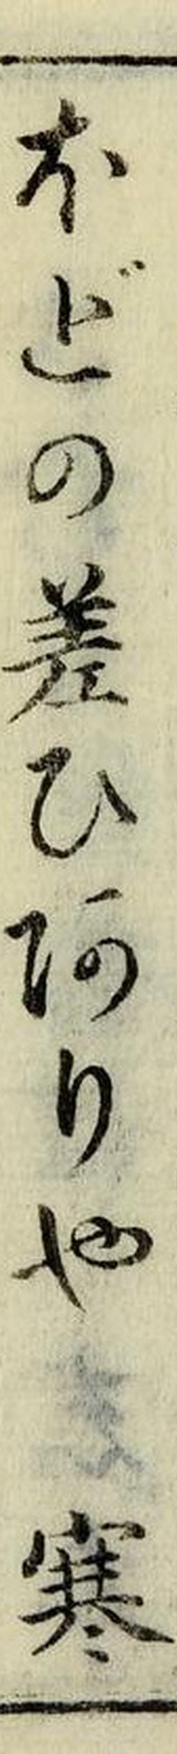ほどの差ひありや寒
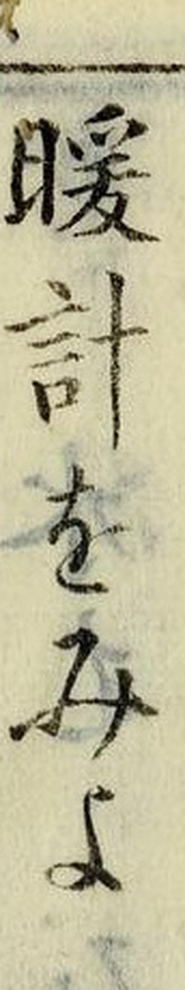暖計をみよ
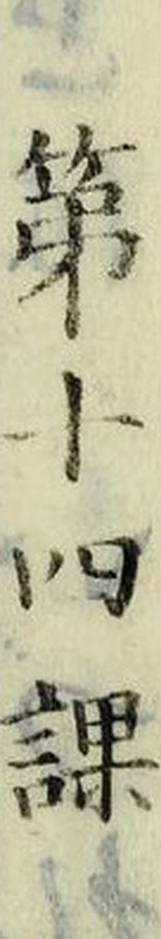第十四課
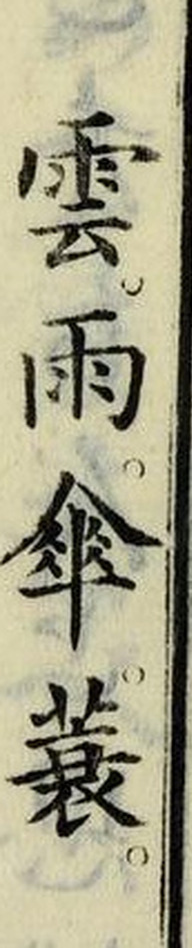雲。雨。傘。蓑。
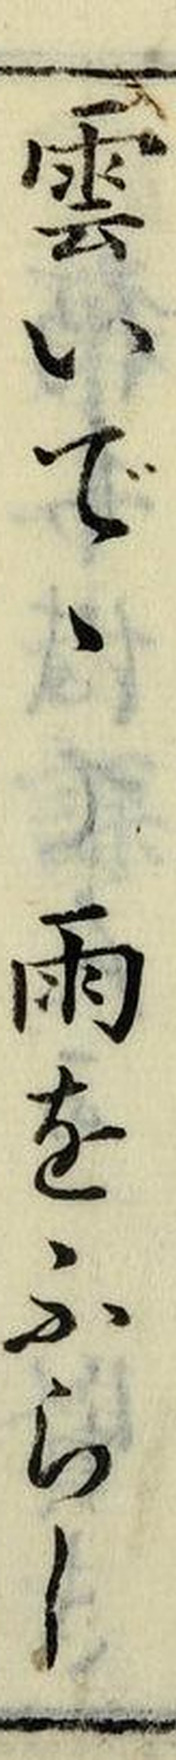雲いでゝ雨をふらし
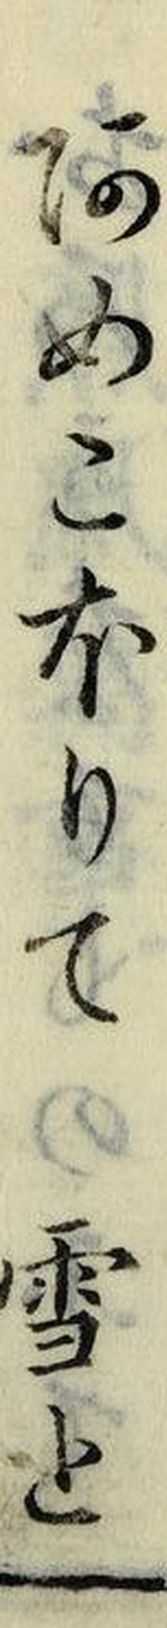あめこほりて雪と
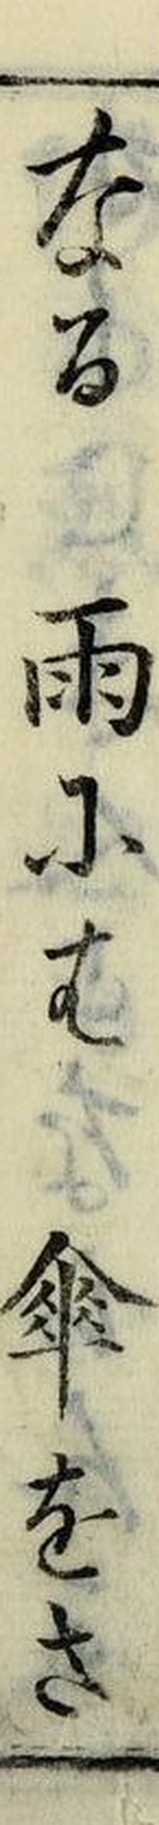なる雨には傘をさ
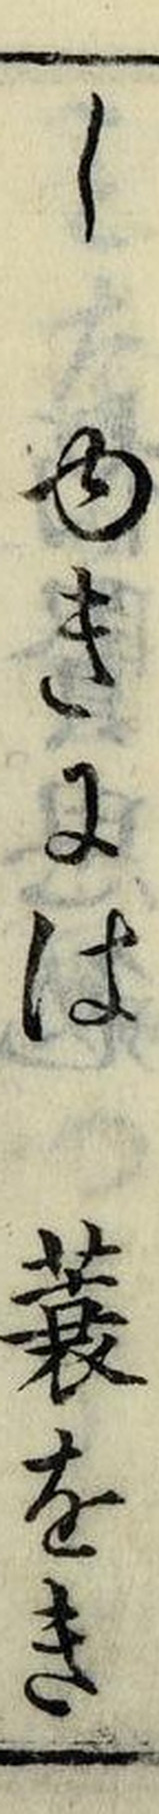しゆきには蓑をき
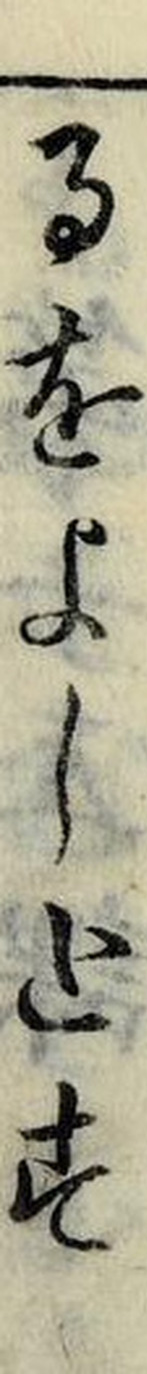るをよしとす

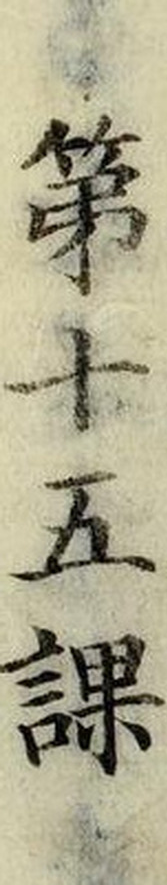第十五課
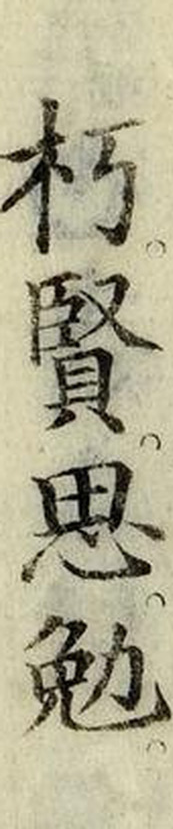朽。賢。思。勉。
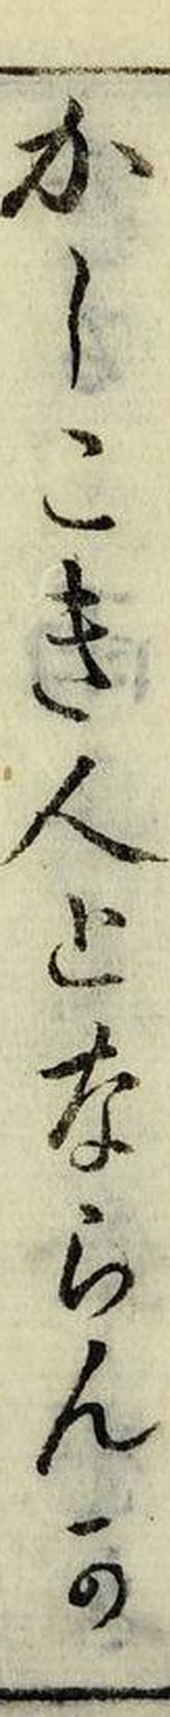かしこき人とならんか
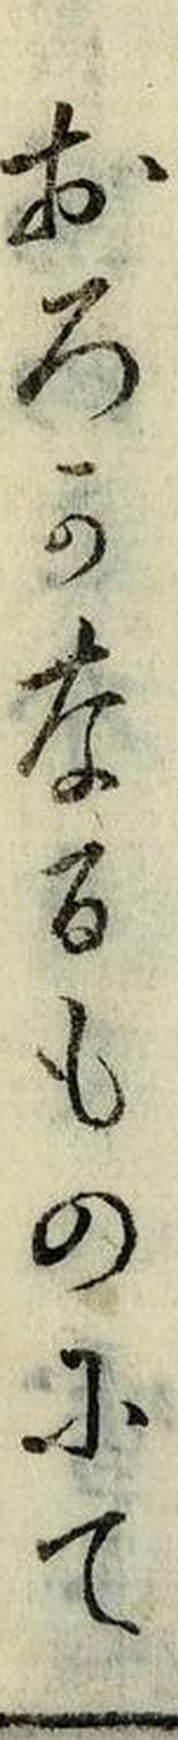おろかなるものにて
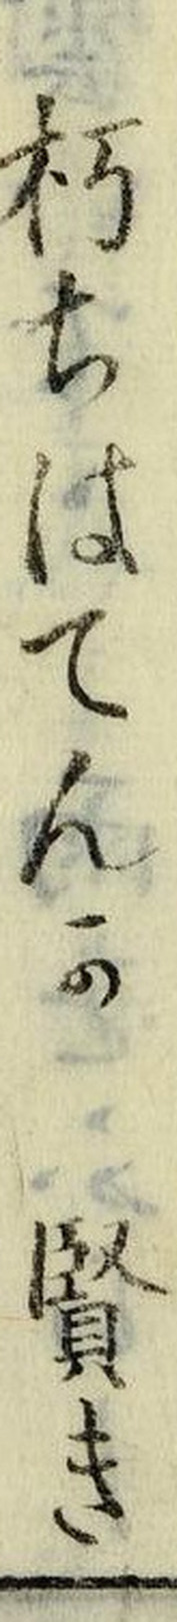朽ちはてんか賢き
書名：小学読本 初等科 巻一
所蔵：福井県文書館 Fukui Prefectural Archives
